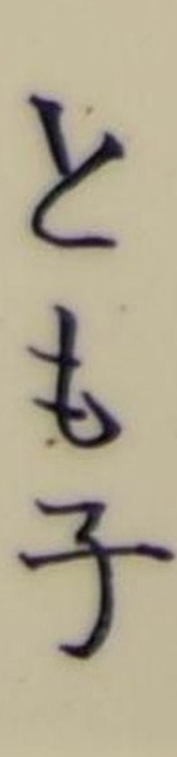とも子
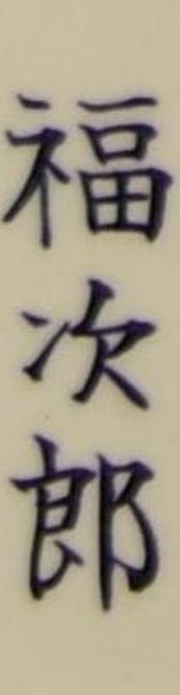福次郎
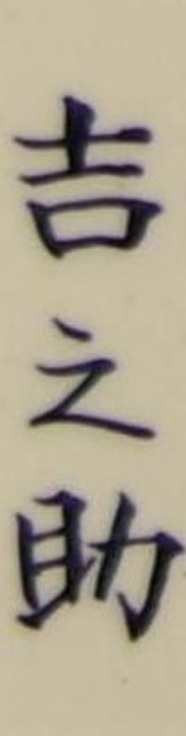吉之助
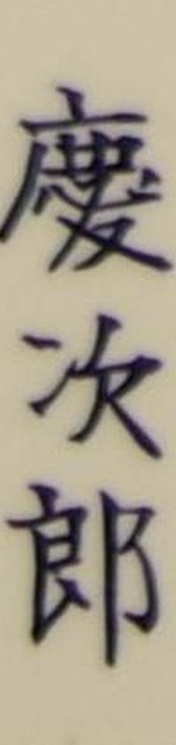慶次郎
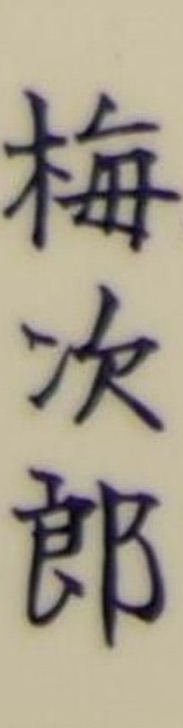梅次郎
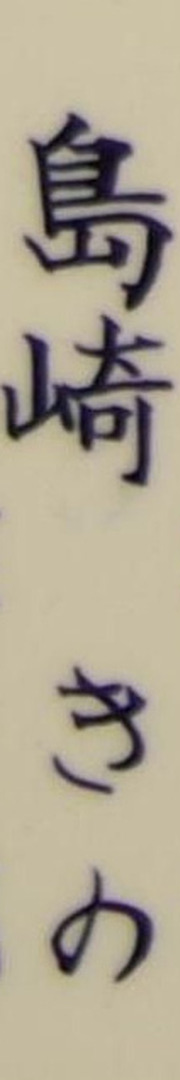島崎きの
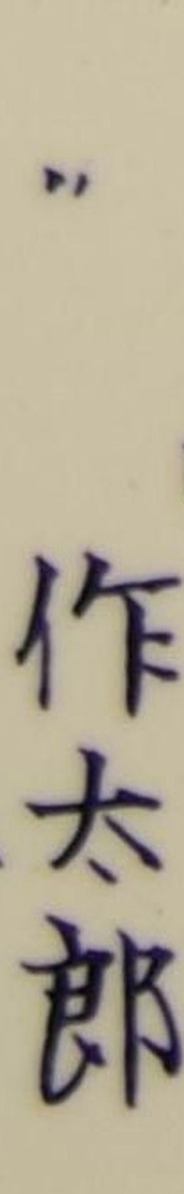作太郎
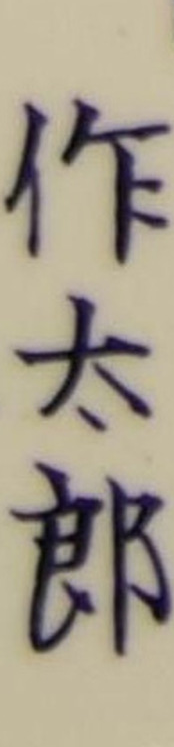作太郎
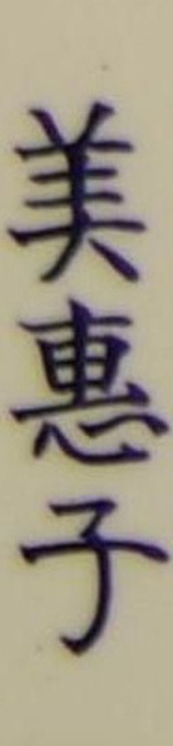美恵子

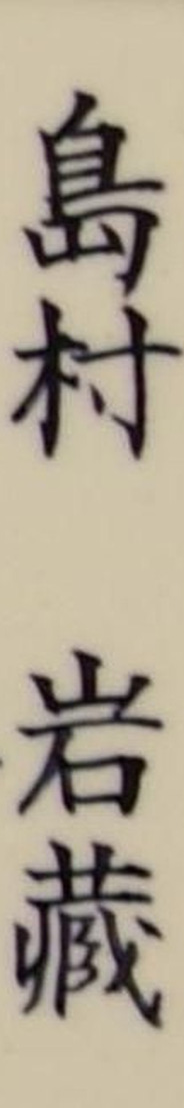島村岩蔵
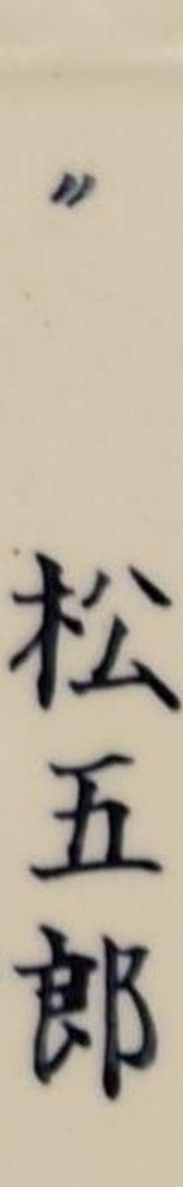松五郎
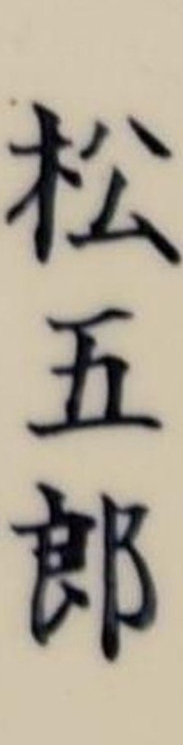松五郎
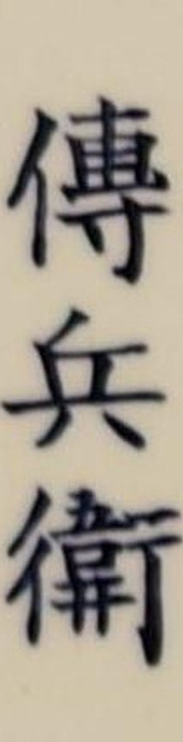傳兵衛
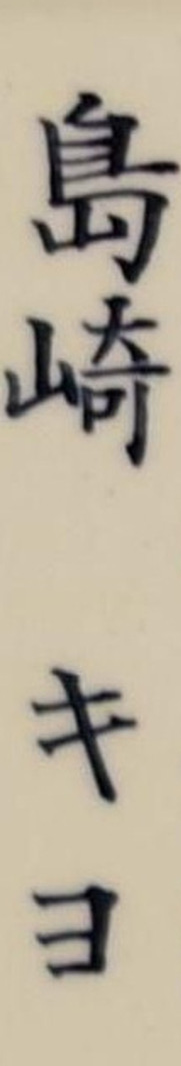島崎キヨ
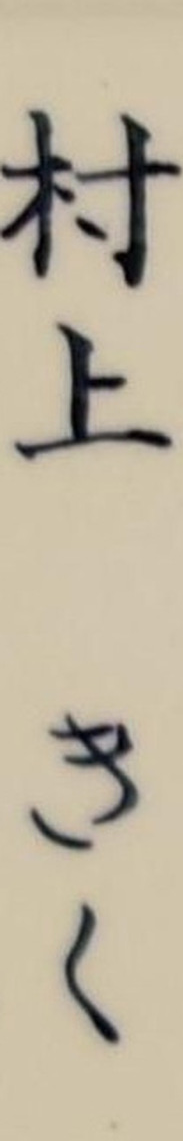村上きく
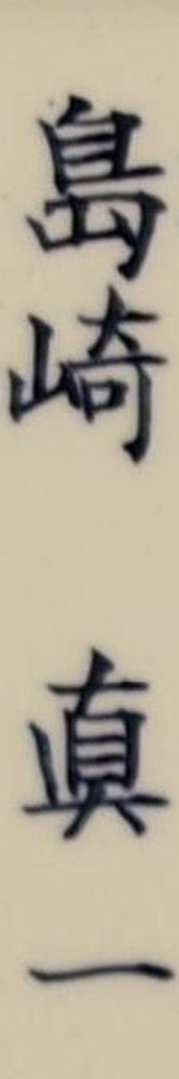島崎真一
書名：A~D
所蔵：koyasan kongobuji
